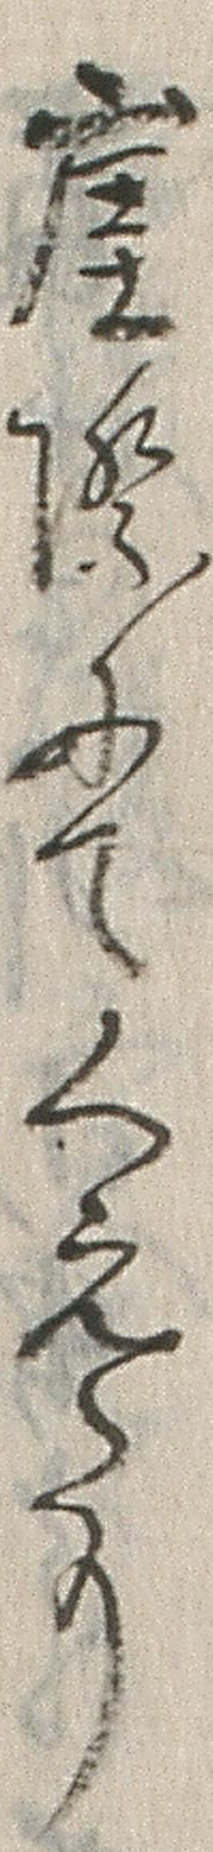崖際にてくえたり
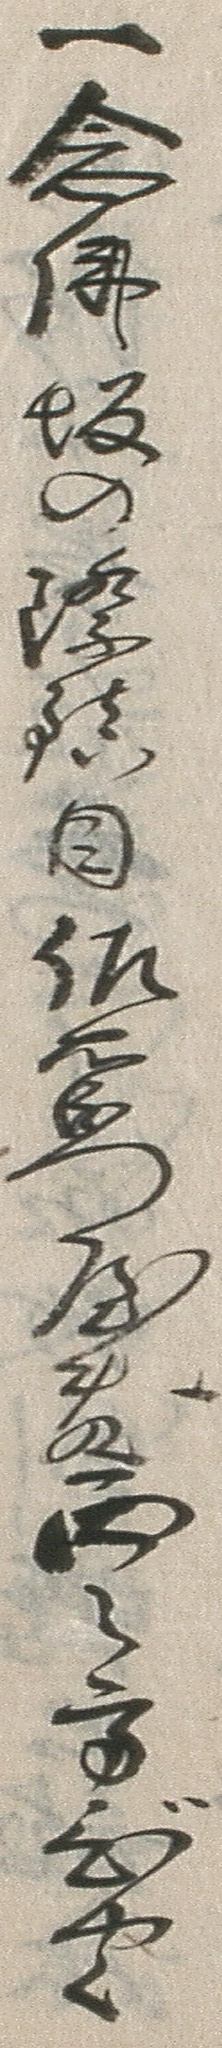一念仏坂の際鎮目佐右衛門屋敷西の方びやく
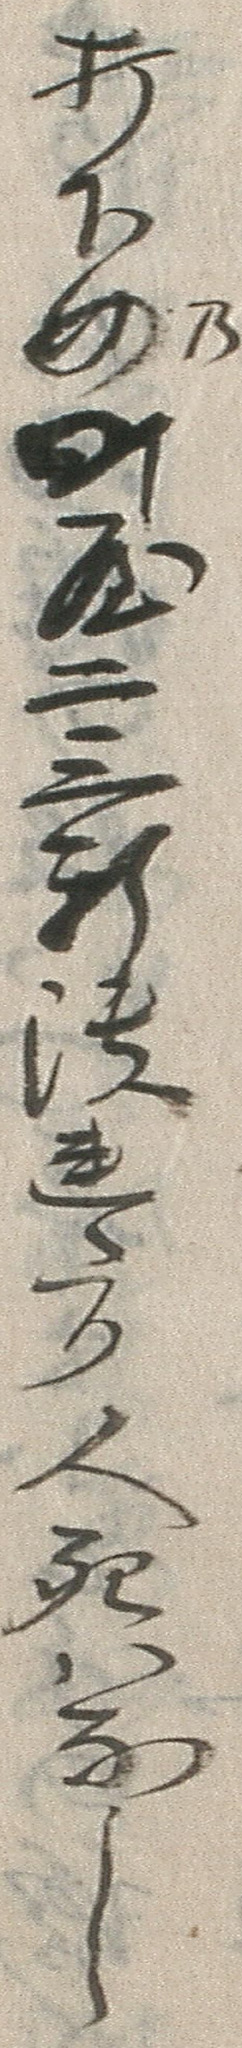打下の町屋二三軒潰れたり人死はなし
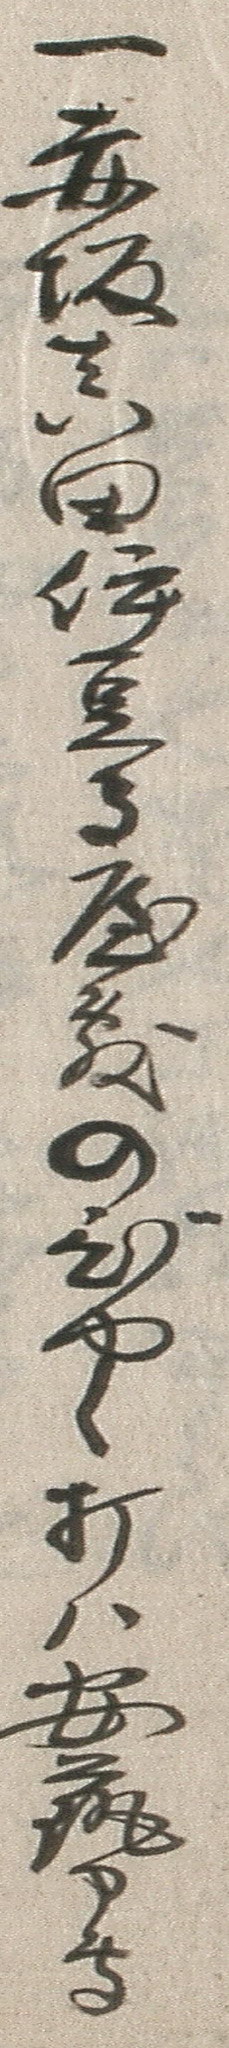一赤坂真田伊豆守屋敷のびやく打は安芸守
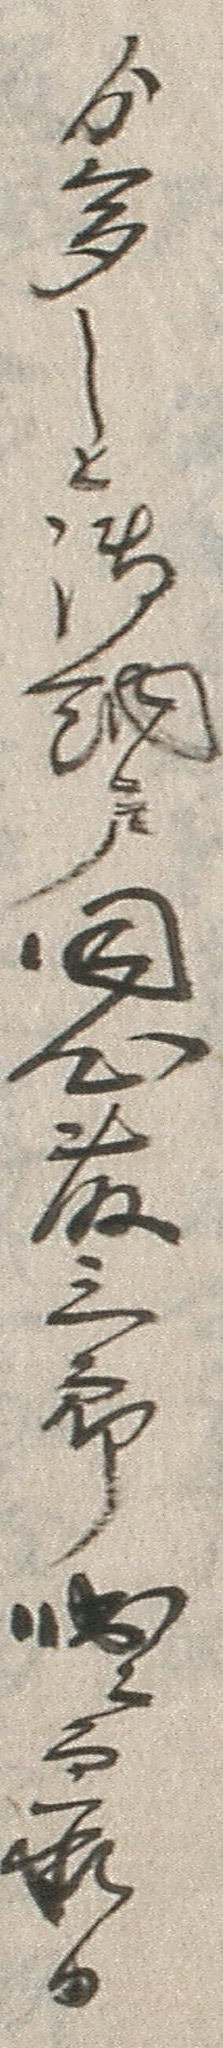ゟ多しと御納戸同心藤三郎咄にて承る
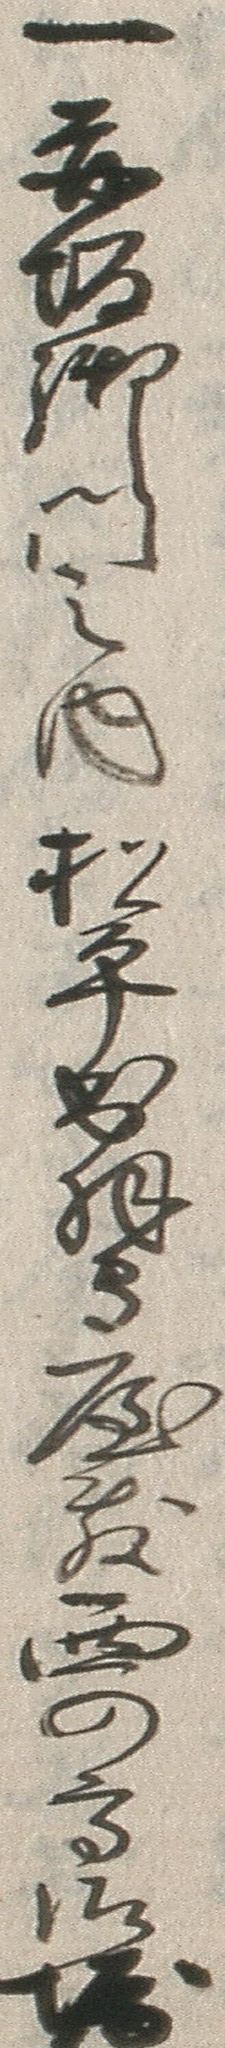一赤坂御門之内松平出羽守屋敷西の方御堀
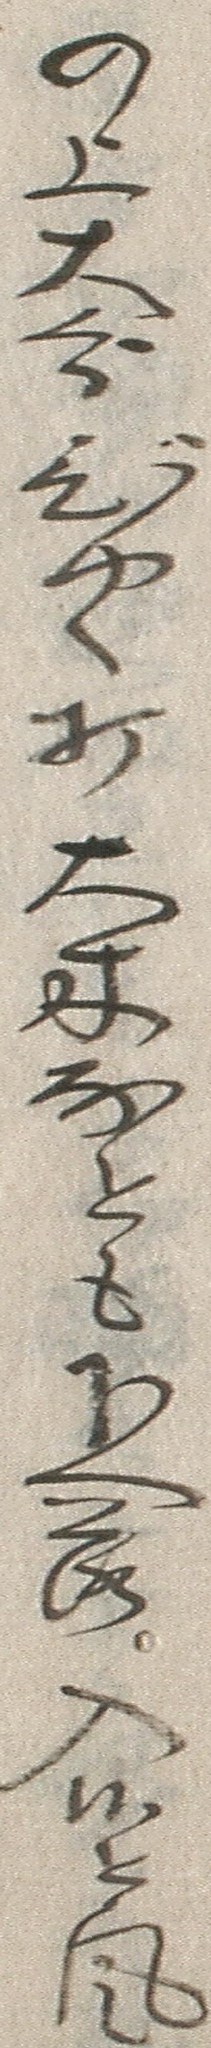の上大分びやく打大木なとも下へ落入候と風
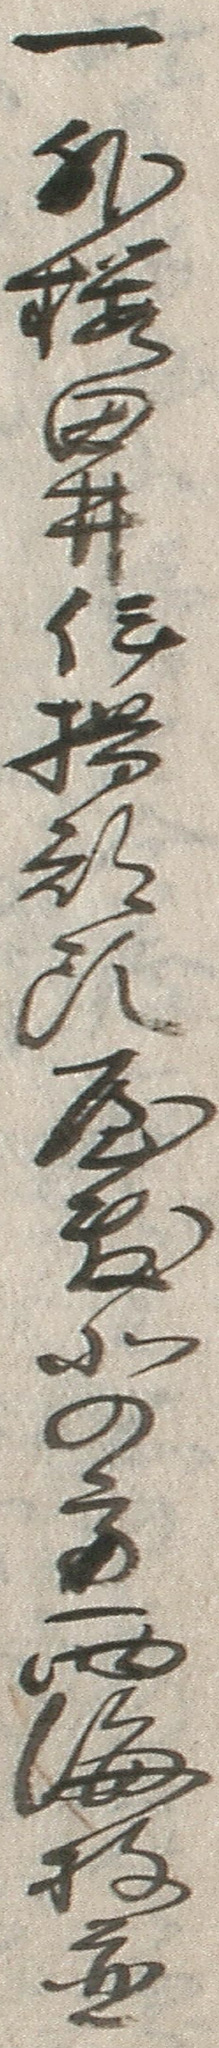一外桜田井伊掃部頭屋敷北の方西海枚並
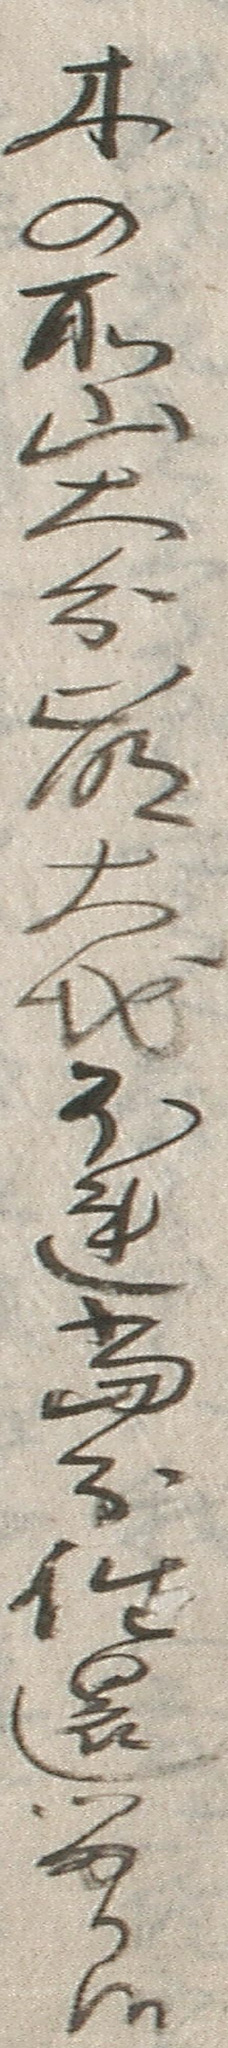木の所山大分崩大地ほれ当分往還留り候
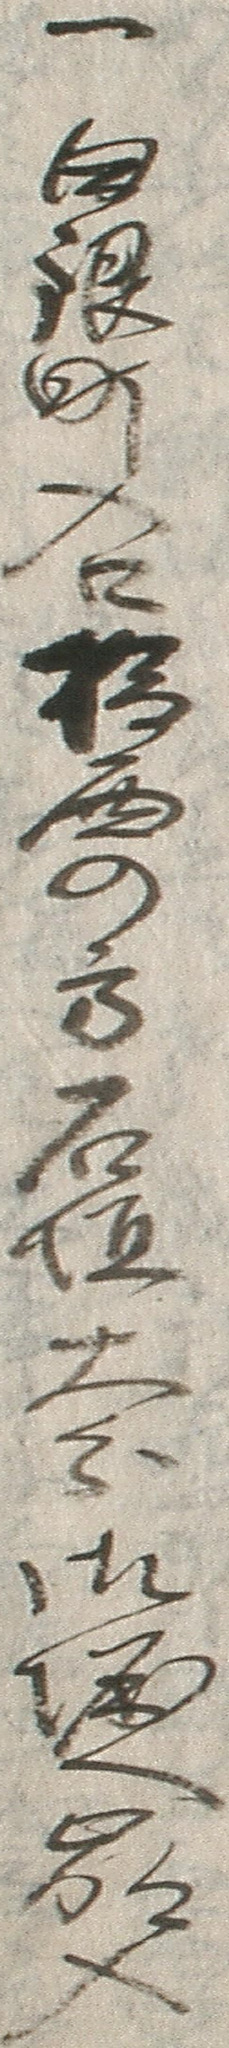一白銀町入口橋西の方石垣大分御堀へ崩入

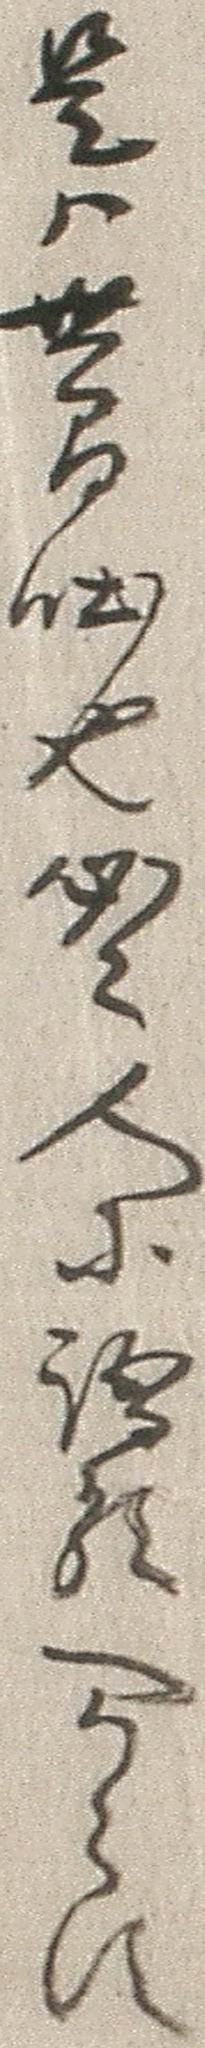是は世間咄也必々人に語るへからす
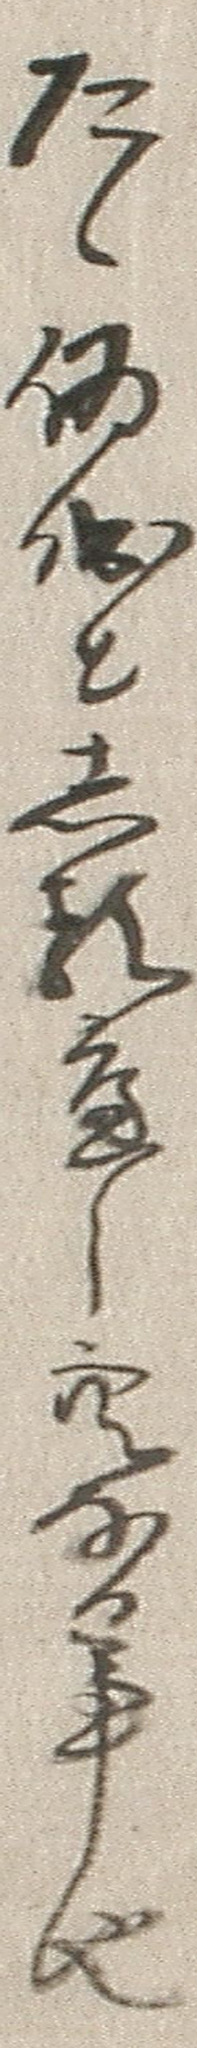たゝ何咄としるへし空なる事也
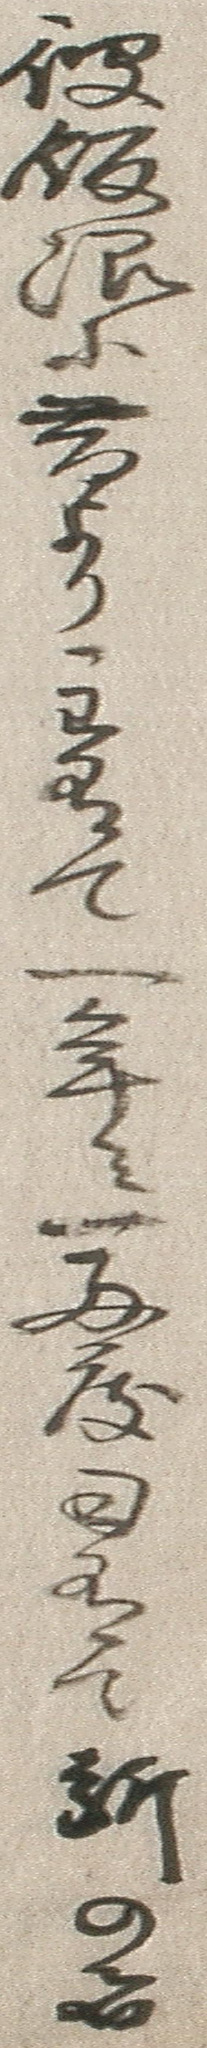彼飯沼に昔より主有て一年之一両度用有て所の者
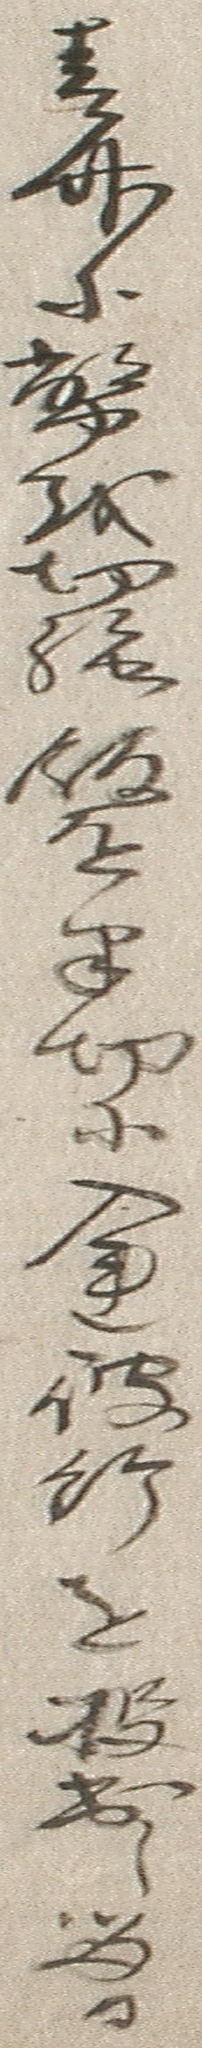青竹に幣を切強飯を半切に入れ彼竹を投出し留る
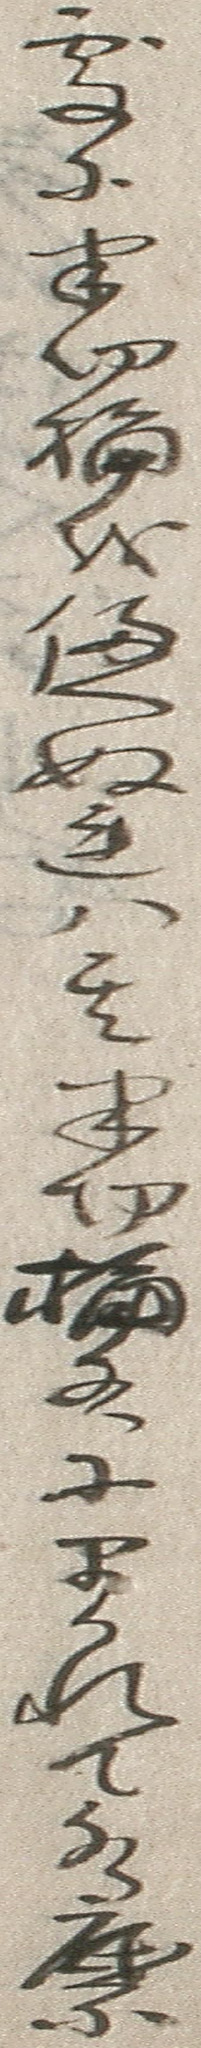処に半切桶を備へぬれは其半切桶水にまかれて水底に
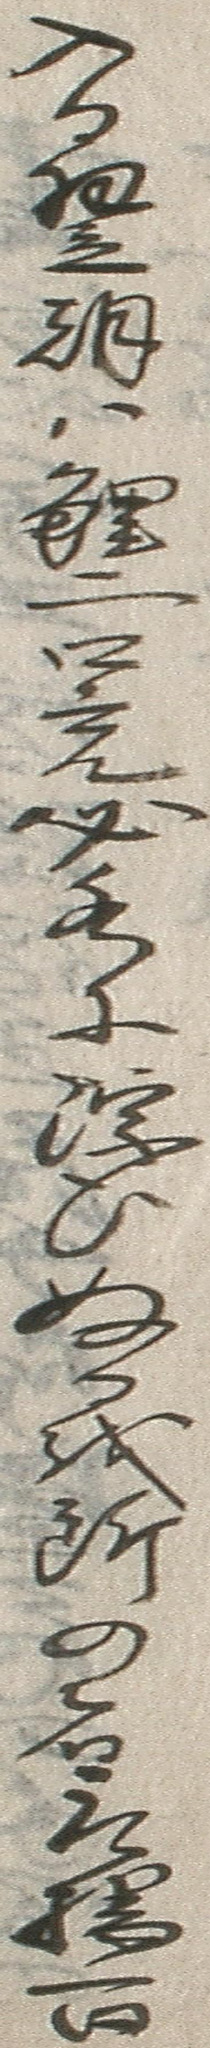入る翌朝は鯉二口充必水に浮ひぬるを所の者取揚百
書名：享保十三年江戸洪水記
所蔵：東京大学地震研究所図書室 Earthquake Research Institute Library, The University of Tokyo, JAPAN
